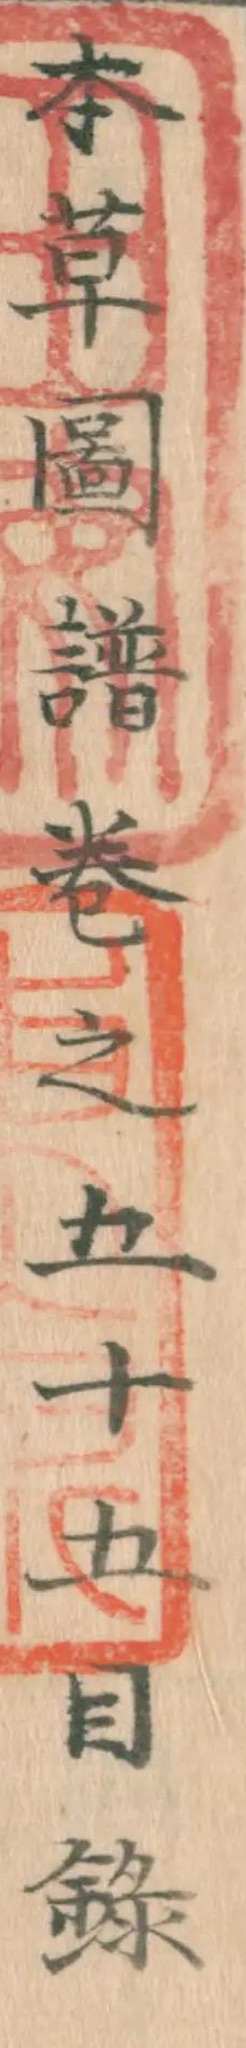本草図譜巻之五十五目録

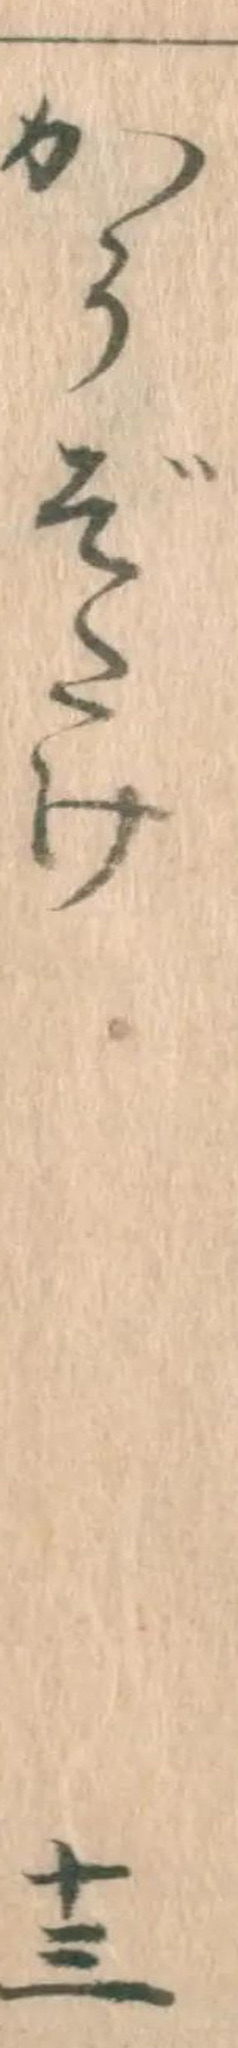同かうぞたけ十三
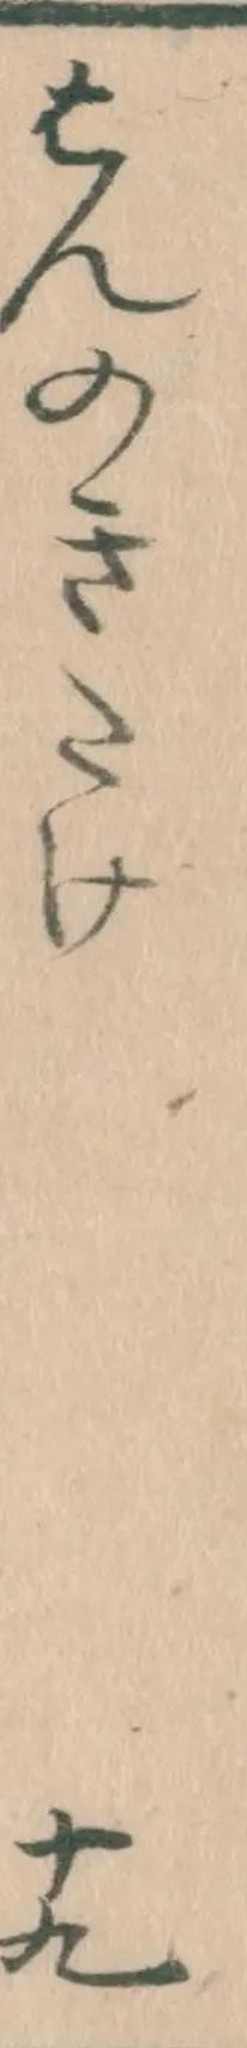はんのきたけ十九

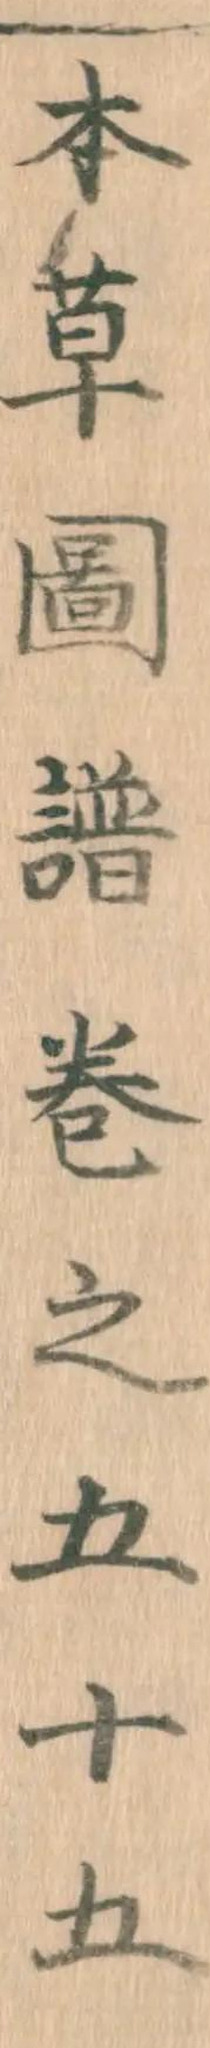本草図譜巻之五十五
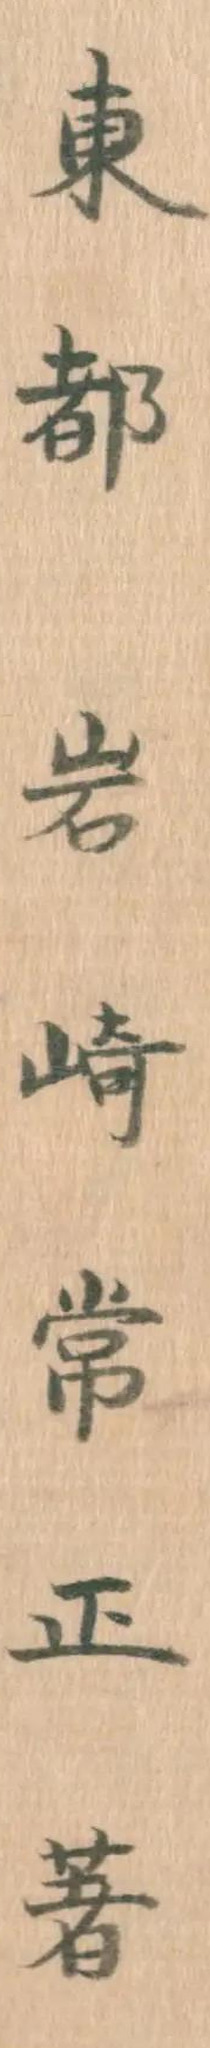東都岩崎常正著

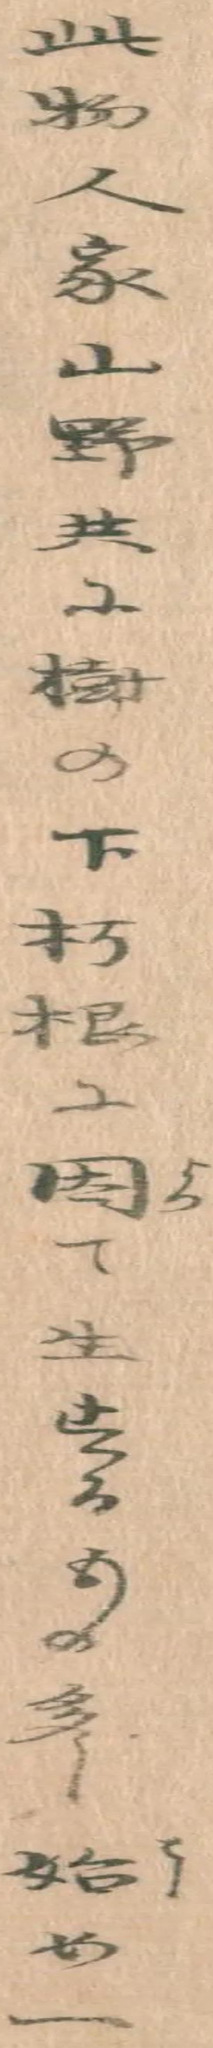此物人家山野共に樹の下朽根に因て生するもの多し始め一
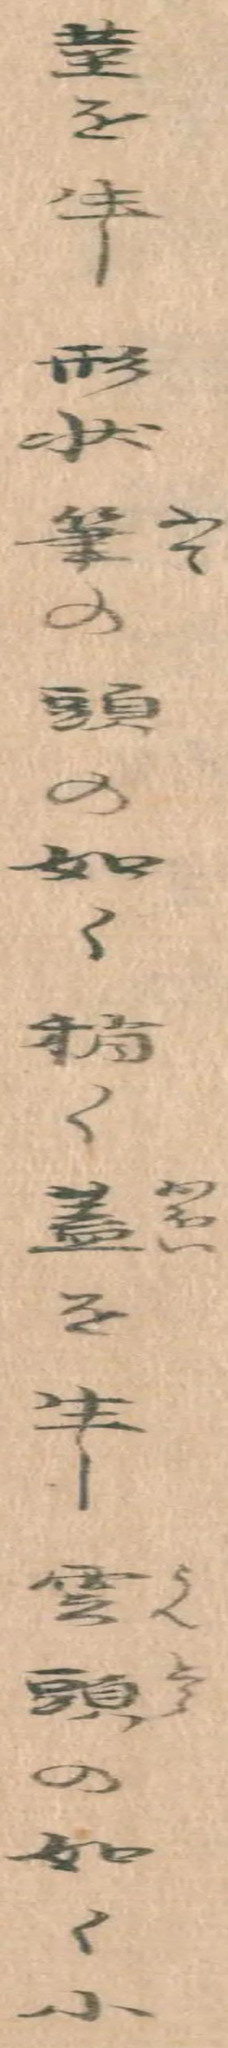茎を生し形状筆の頭の如く稍く蓋を生し雲頭の如く小
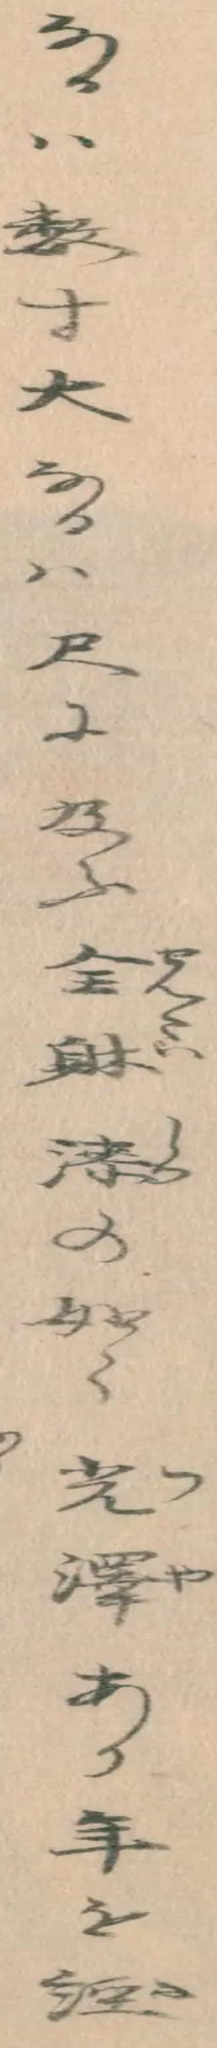なるは数寸大なるは尺に及ふ全体漆の如く光沢あり年を経
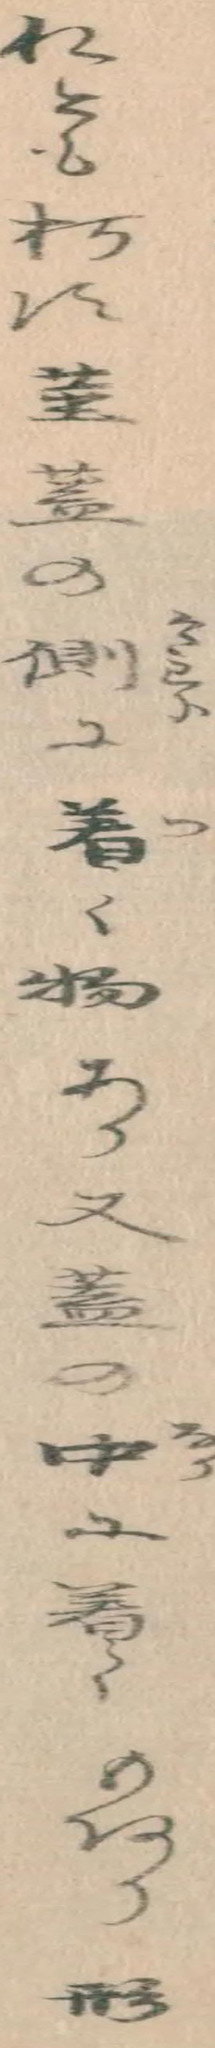れとも朽す茎蓋の側に着く物あり又蓋の中に着くもあり形
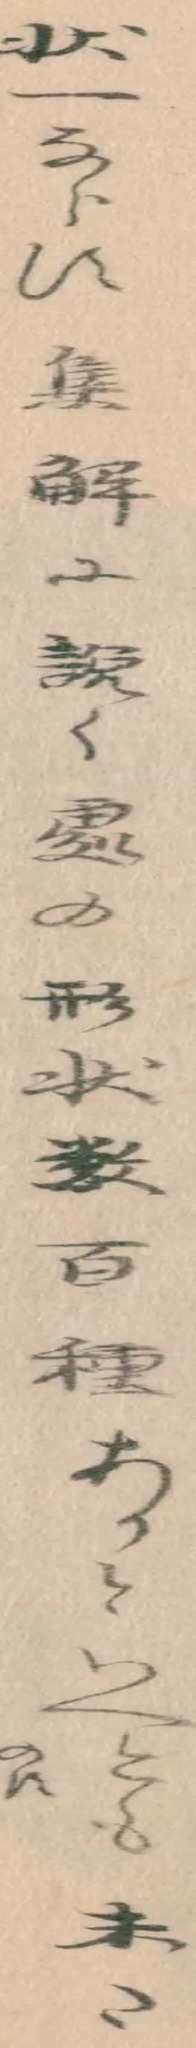状一ならす集解に説く処の形状数百種ありといへとも未た
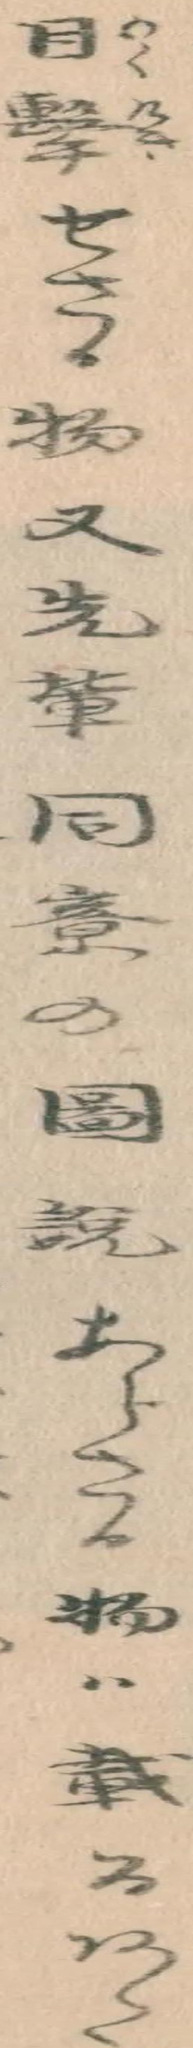目撃せさる物又先輩同寮の図説あらさる物は載るあた
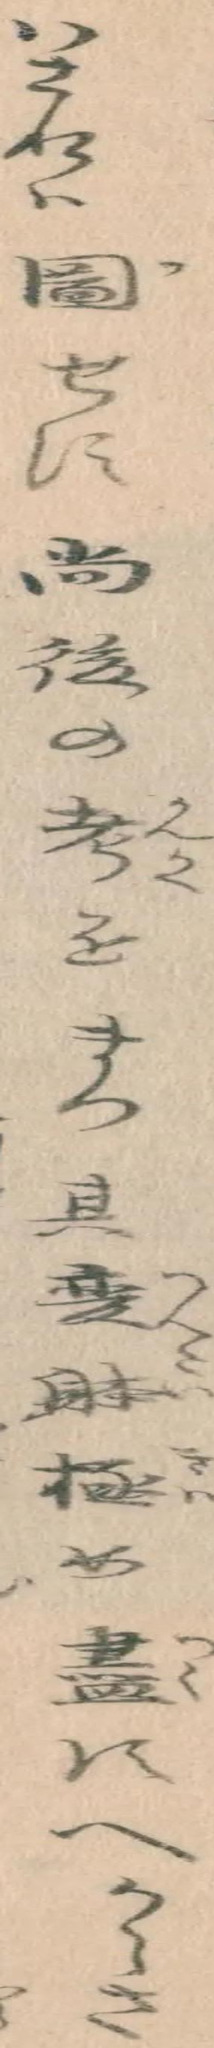はされは図せす尚後の考をまつ其変体極め尽すへからさ
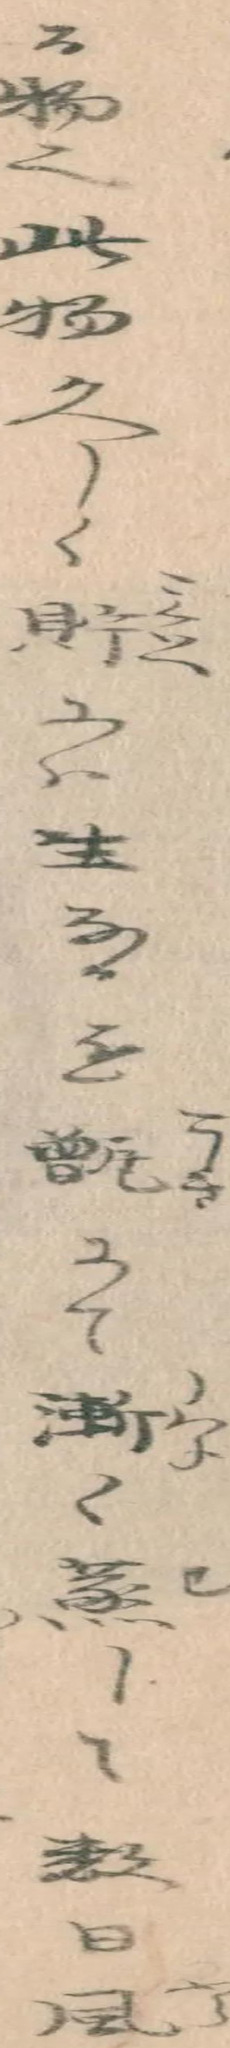る物也此物久しく貯には生なるを甑にて漸く蒸して数日風
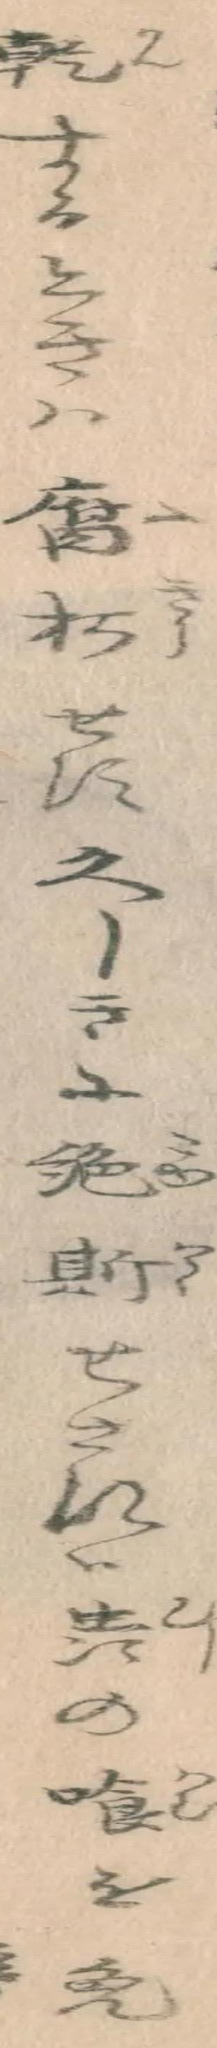乾するときは腐朽せす久しきに絶斯せされは虫の喰を免
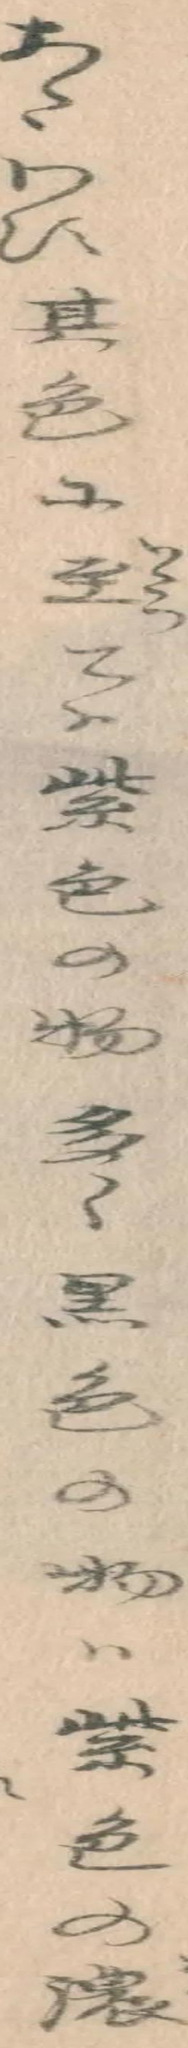あたわす其色に至ては紫色の物多く黒色の物は紫色の濃
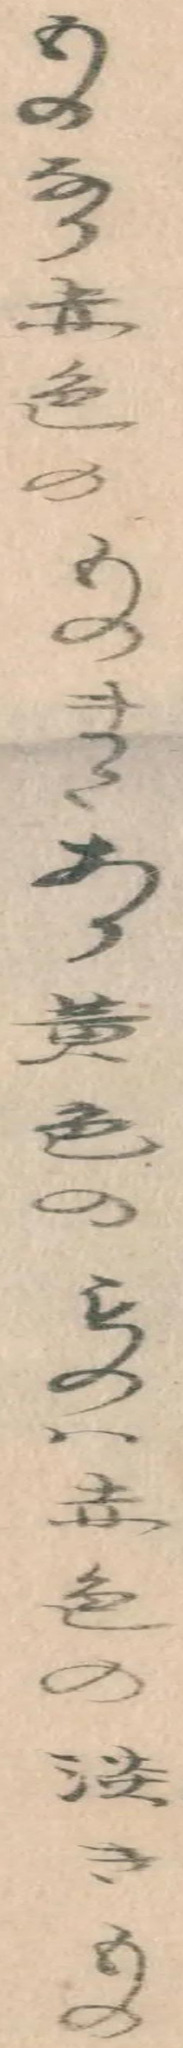ものなり赤色のものまたあり黄色のものは赤色の淡きもの
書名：本草図譜. 巻55-57
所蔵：国立国会図書館 National Diet Library, JAPAN
